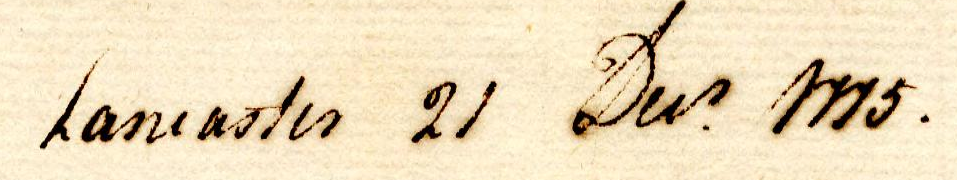Lancaster 21 Dec^r. 1775.
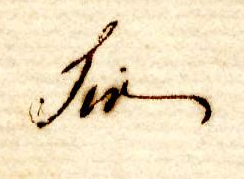Sir
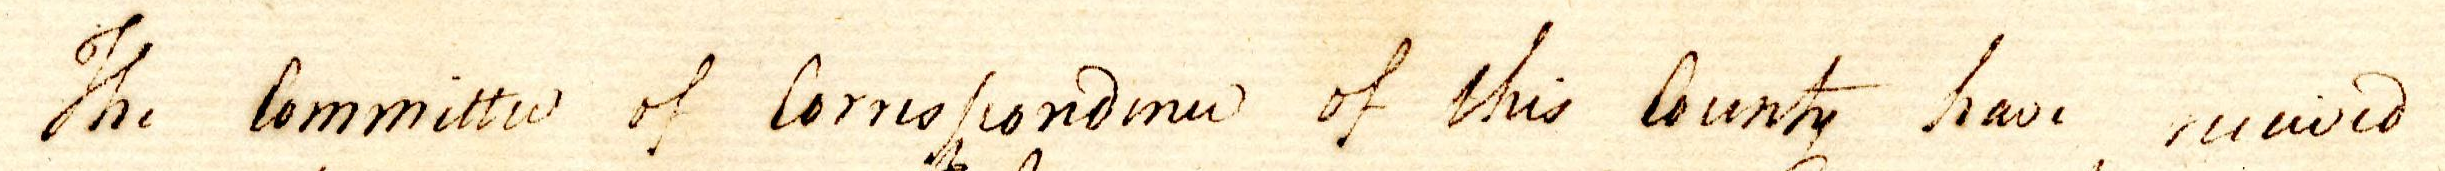The Committee of Correspondence of this County have received
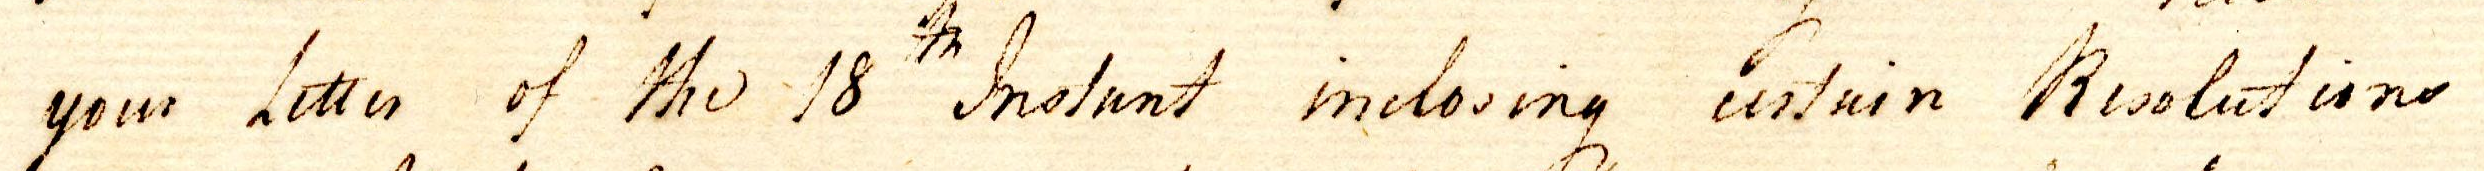your Letter of the 18^th Instant inclosing certain Resolutions
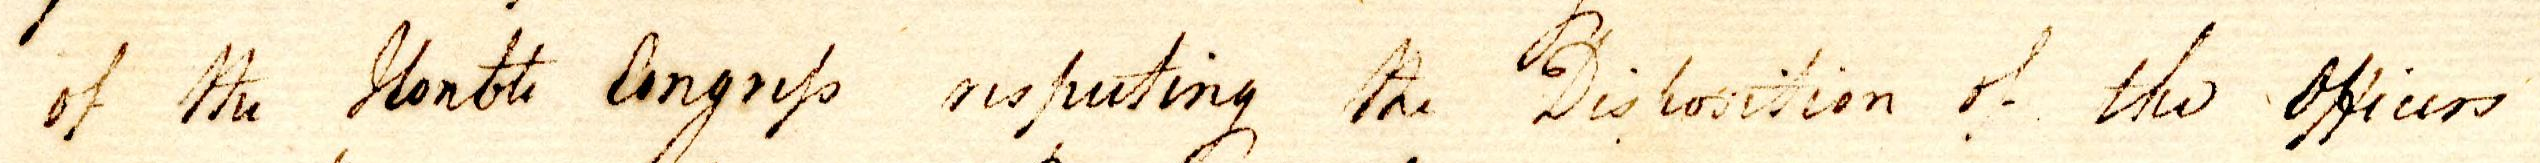of the Honble Congress respecting the Disposition of the Officers
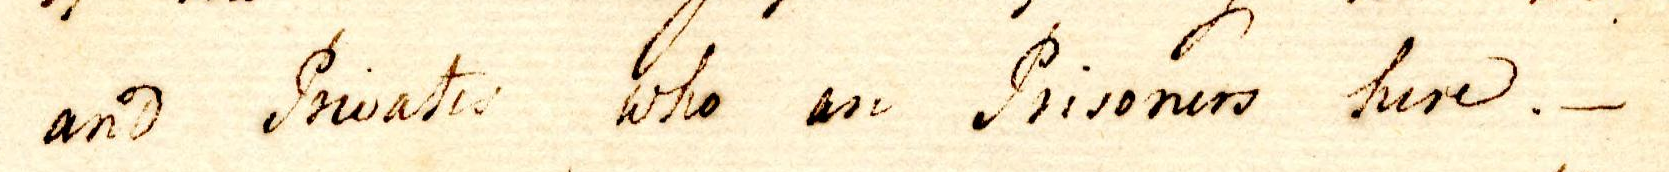and Privates who are Prisoners here.
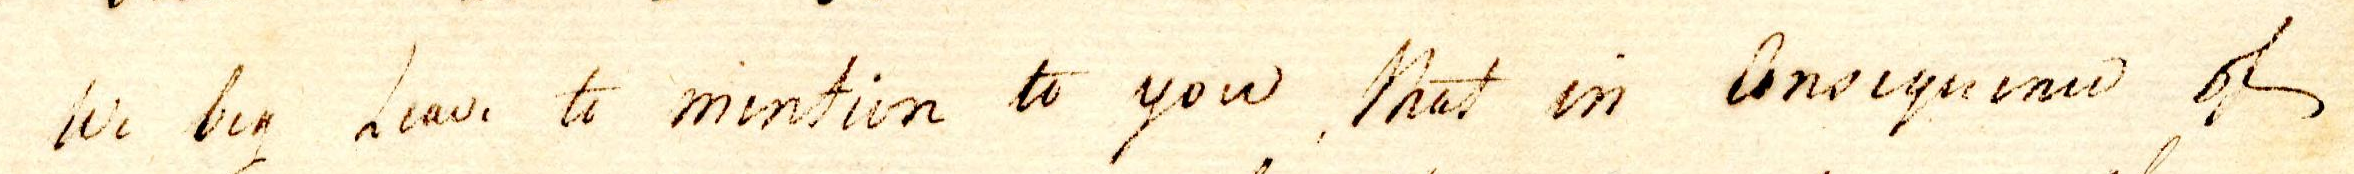We beg Leave to mention to you that in Consequence of
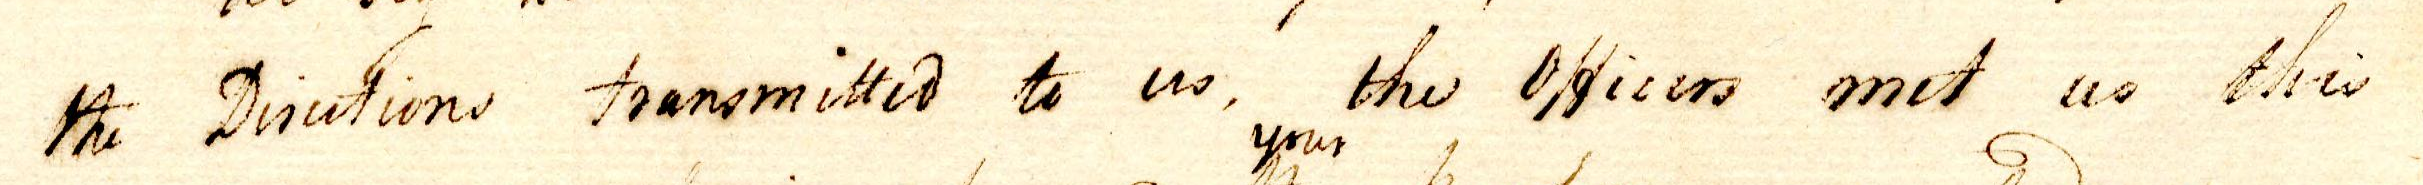the Directions transmitted to us, the Officers met us this
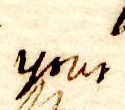your
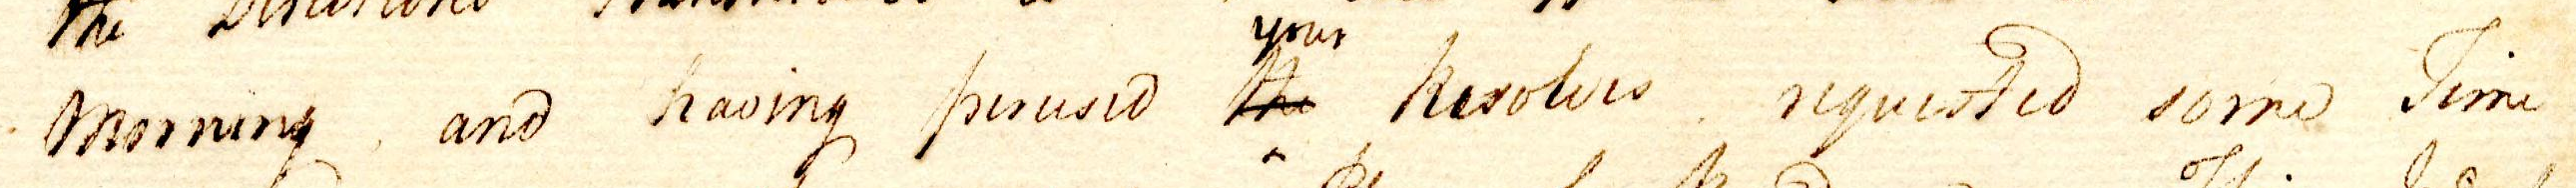Morning and having perused the ^ Resolves requested some Time
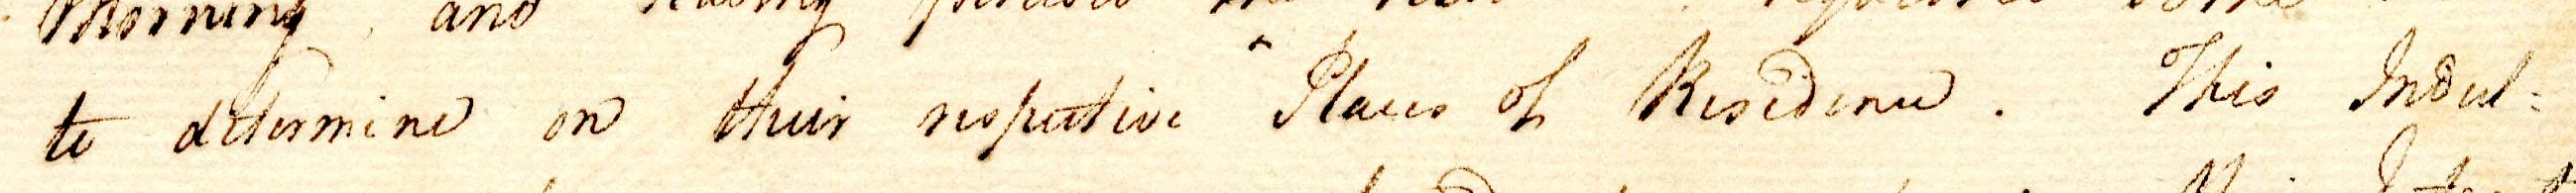to determine on their respective Places of Residence. This Indul-
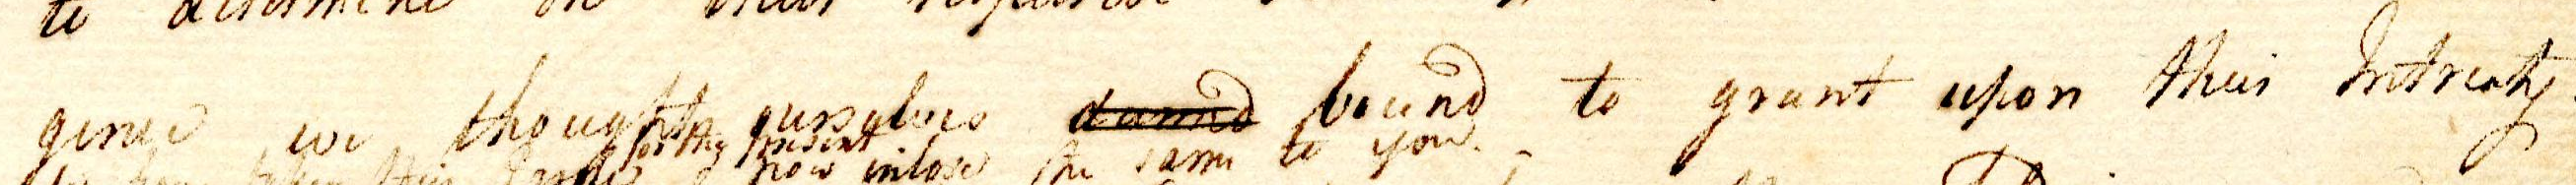gence, we thought ourselves damnd bound to grant upon their Intreaty.
